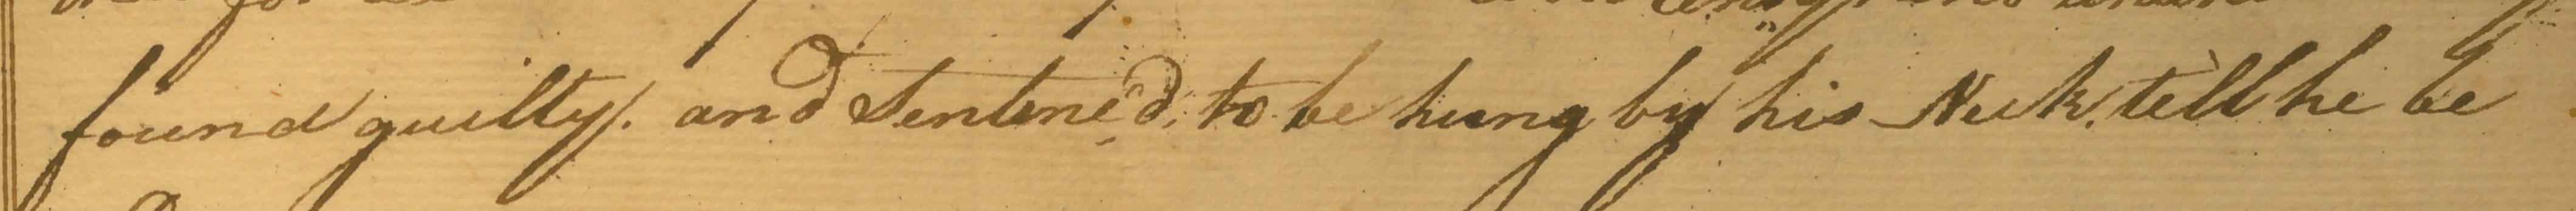found guilty and Sentenc'd to be hung by his Neck till he be
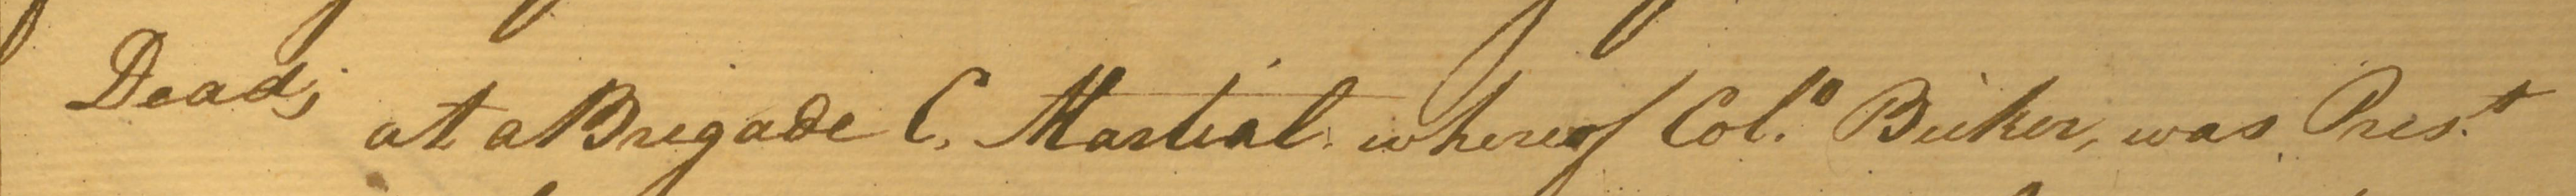Dead; at a Brigade C. Martial whereof Col^o. Becker was Pres^t.
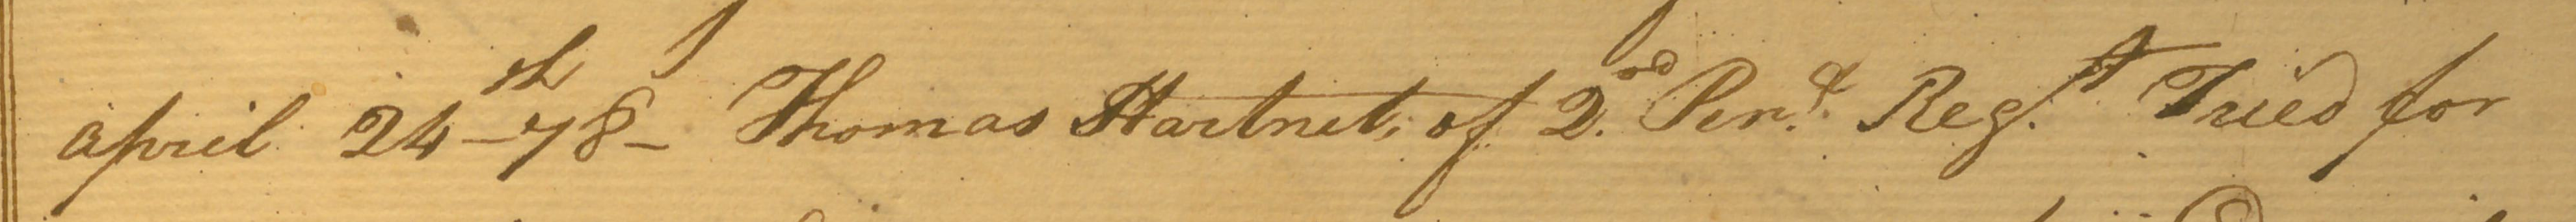april 24^th- 78- Thomas Hartnet of 2^nd. Pen^a. Reg^t. Tried for
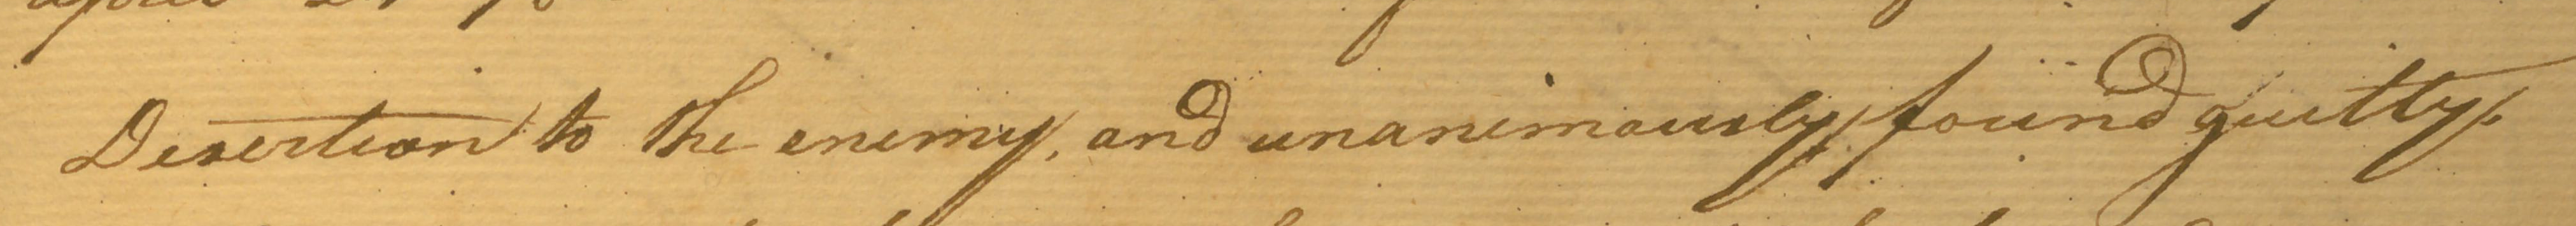Desertion to the enemy and unanimously found guilty
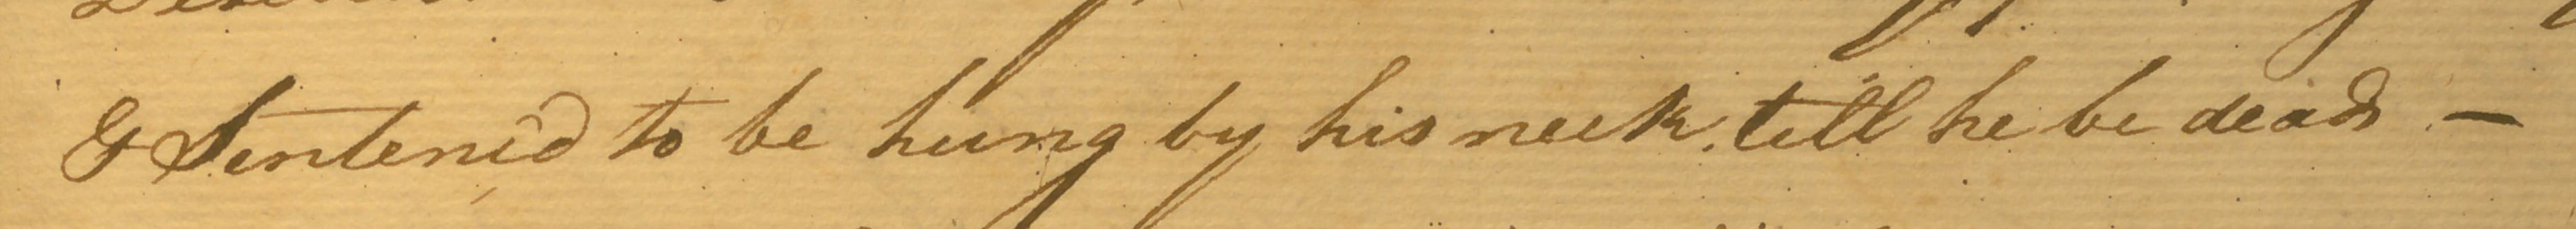& Sentenced to be hung by his neck till he be dead-
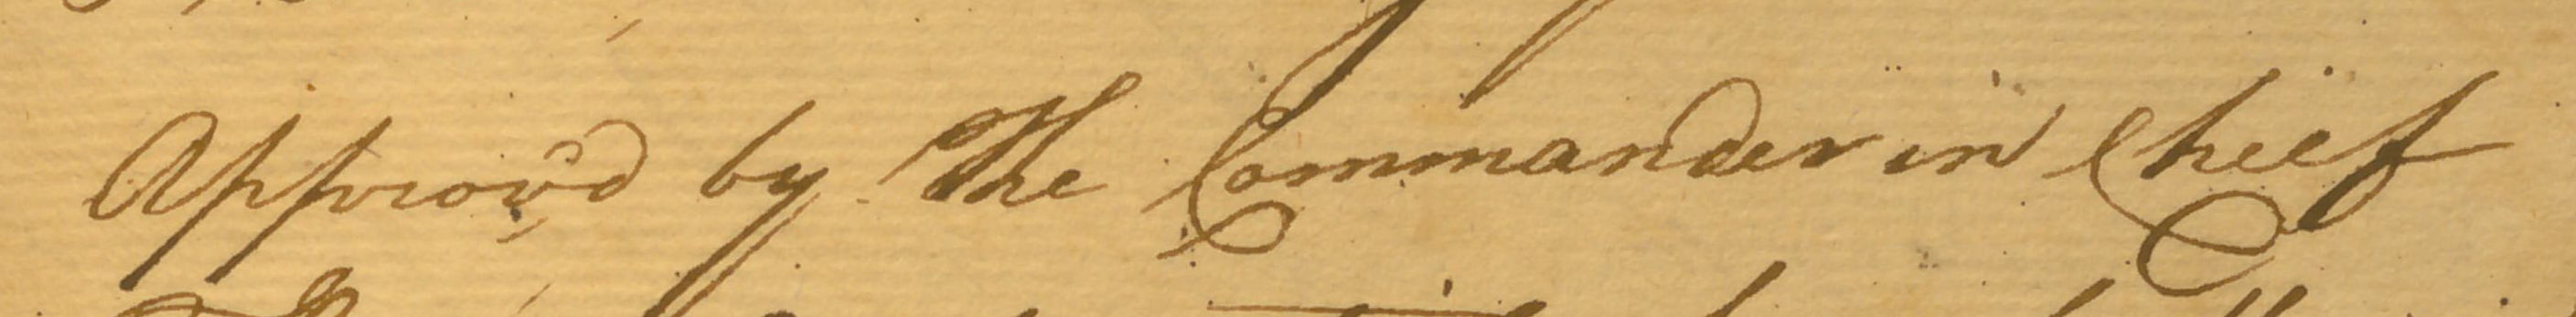Approv'd by The Commander in Chief
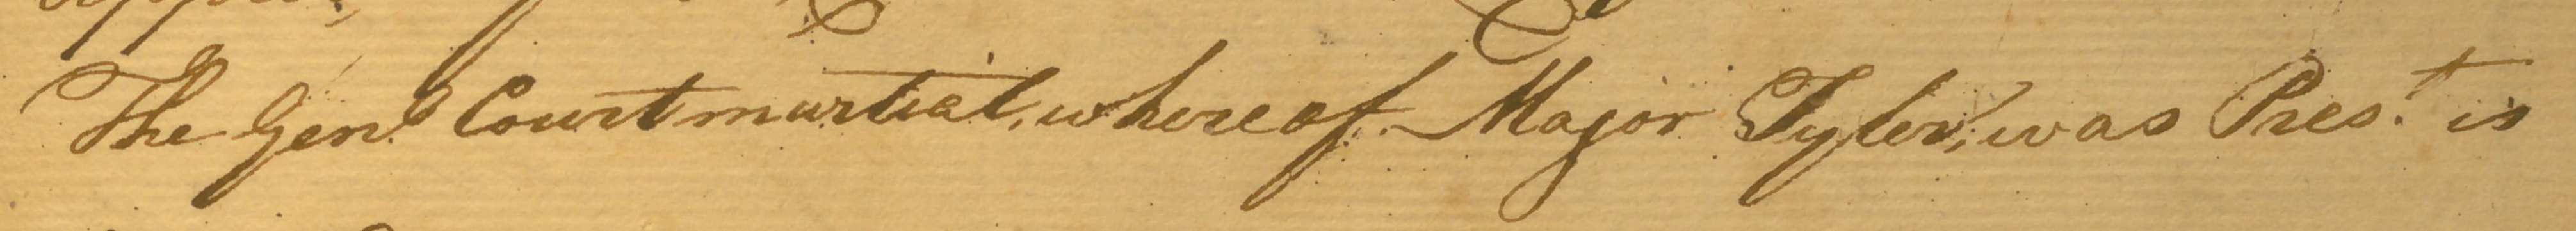The Gen^l. Court martial whereof Major Tyler was Pres^t. is
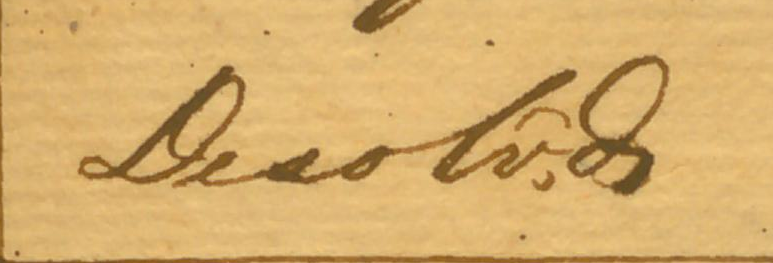Desolv'd
